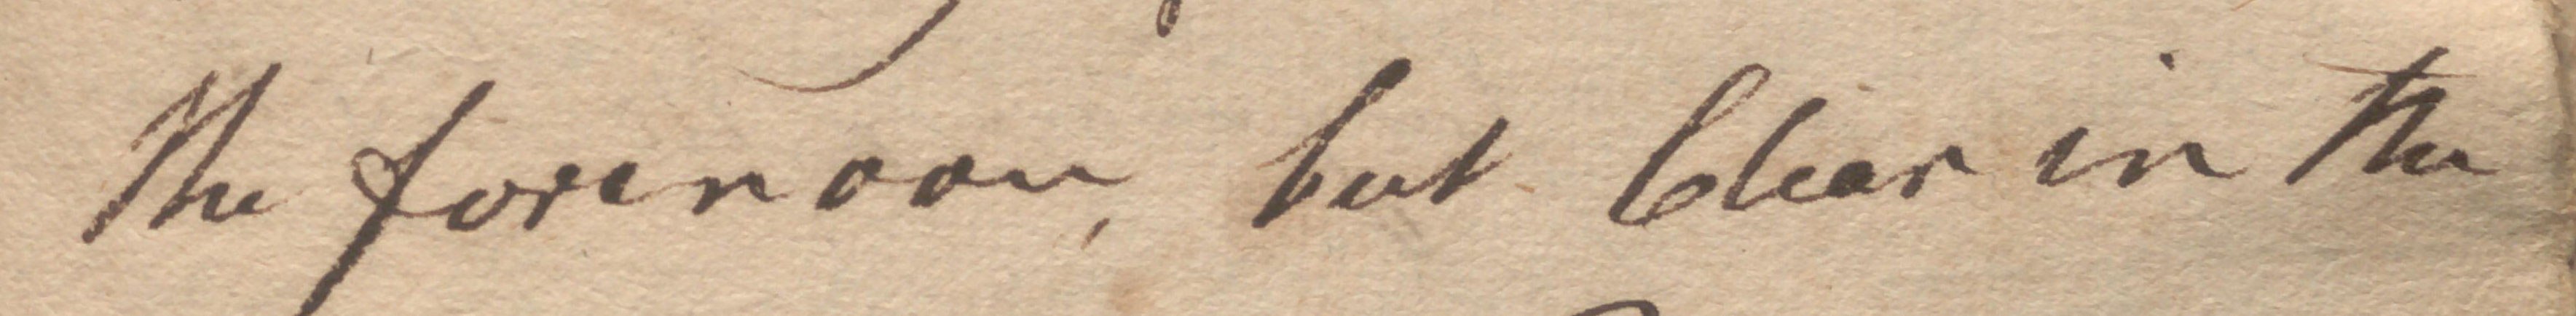the forenoon but Clear in th
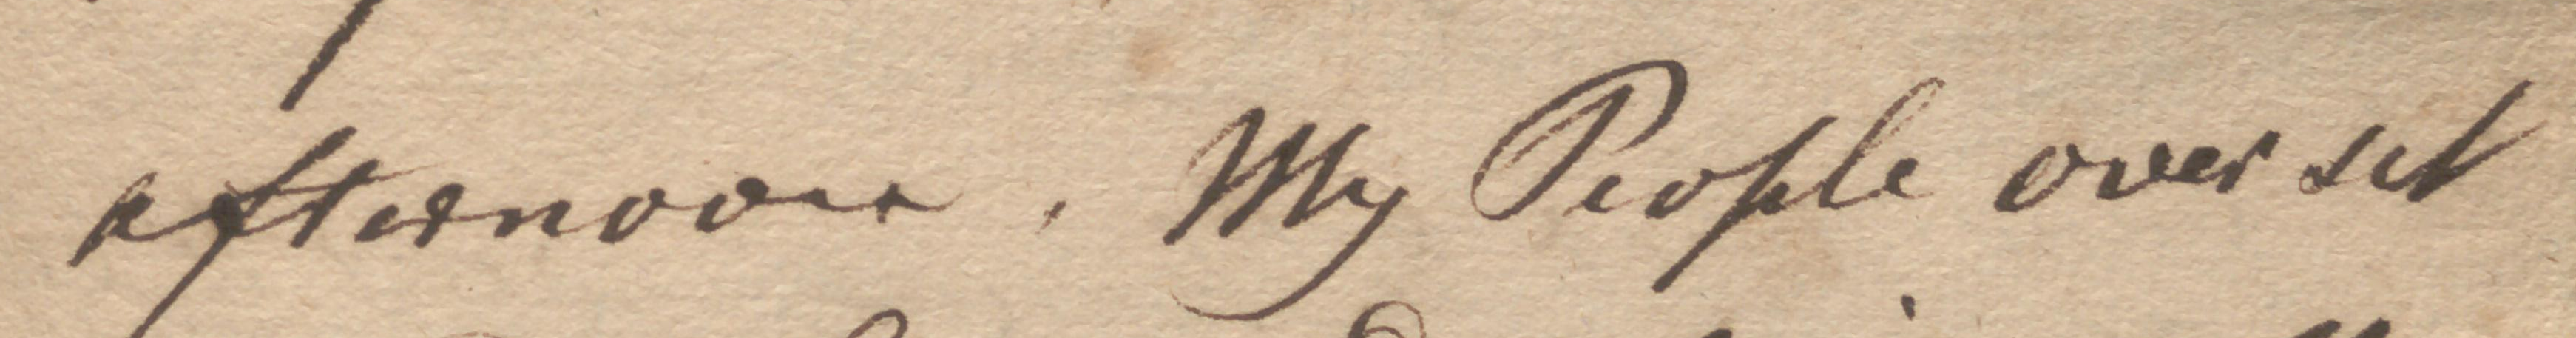afternoon. My People over set
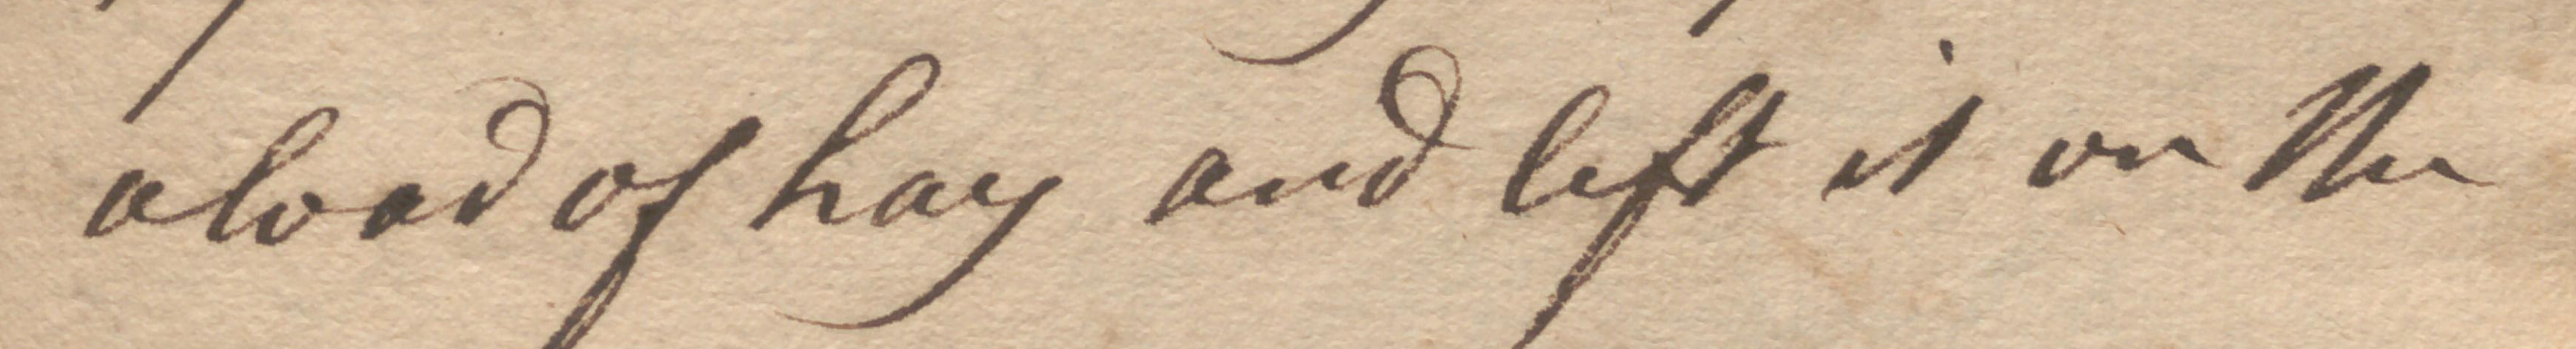a load of hay and left it on the
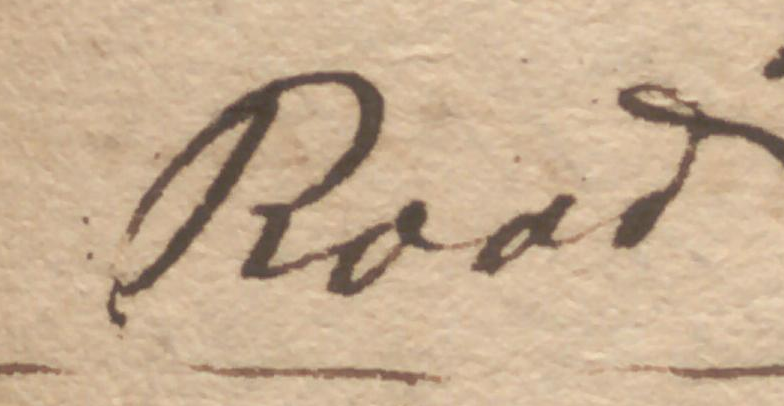Road
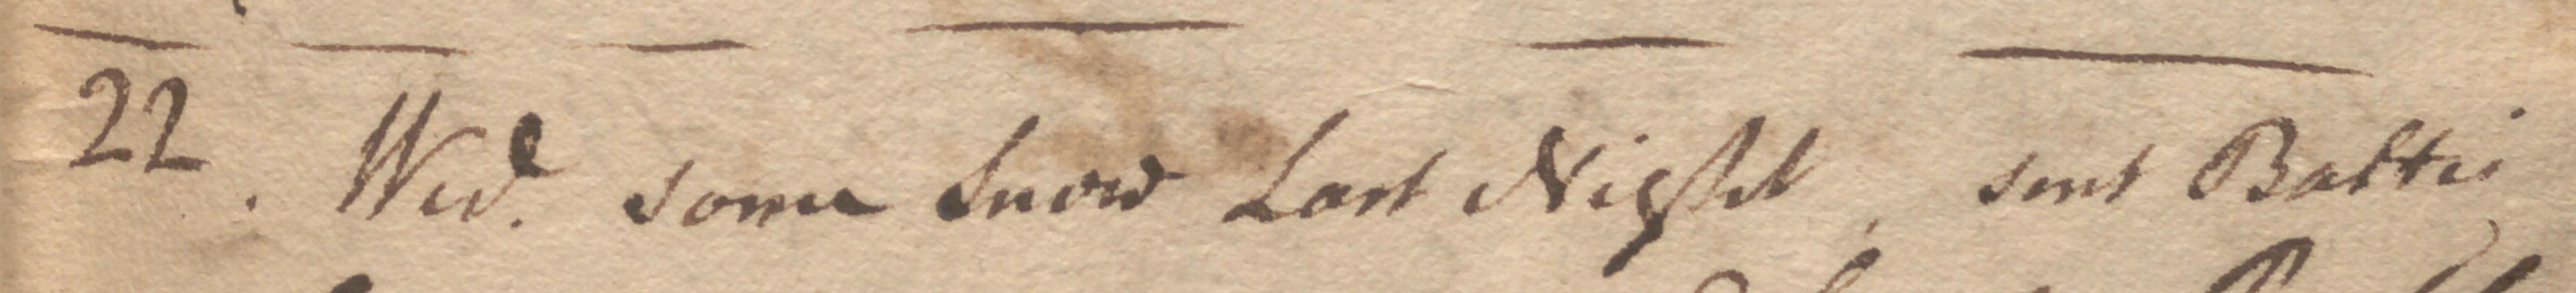2 Wed. some snow Last Night sent Baltes
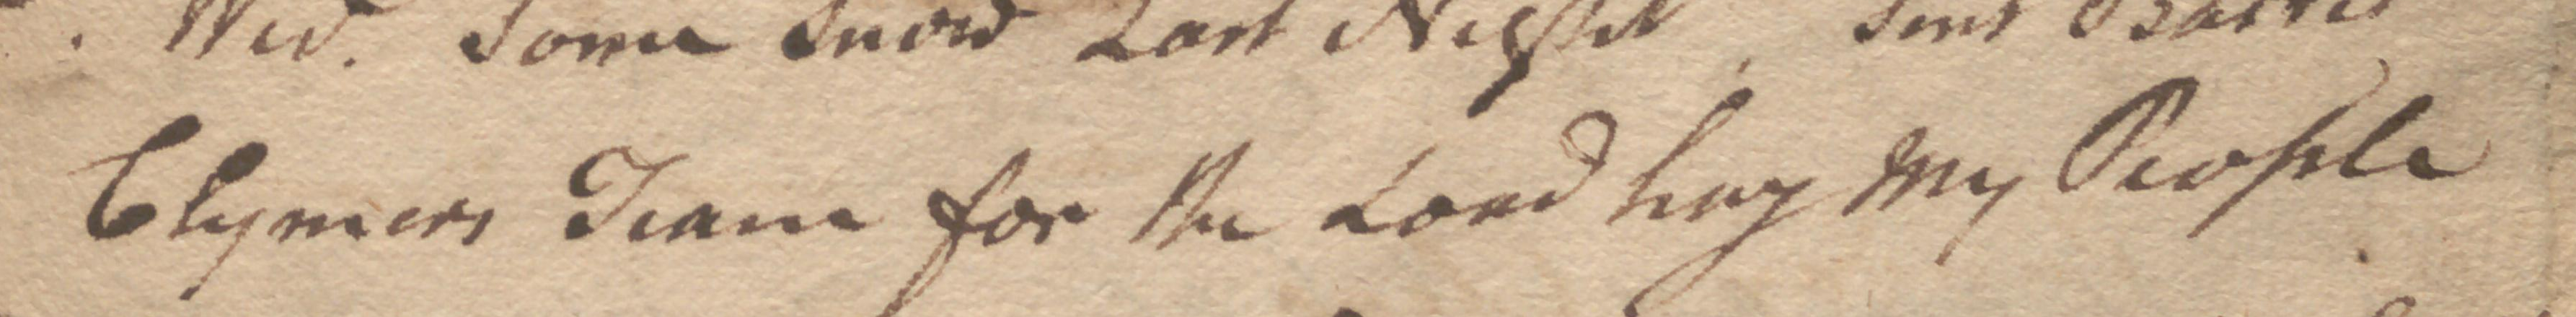Clymers Team for the Load hay my People
